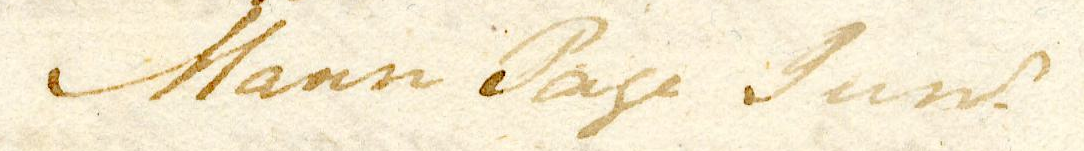Mann Page Jun^r.
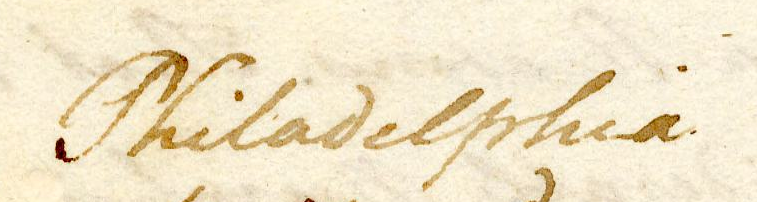Philadelphia
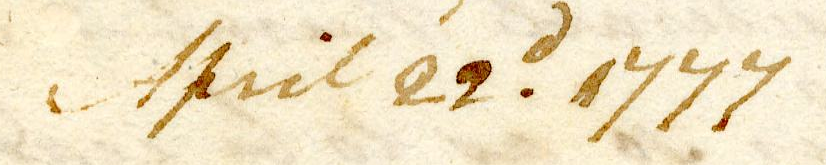April 22^d. 1777
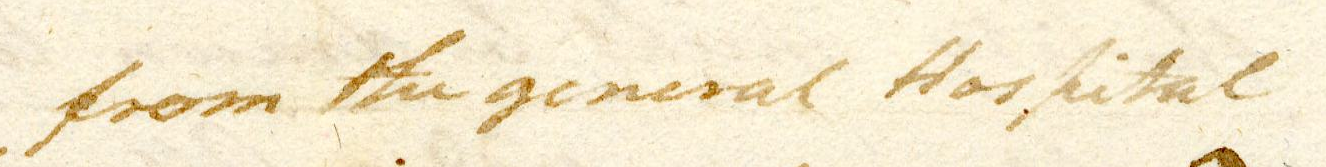from the general Hospital
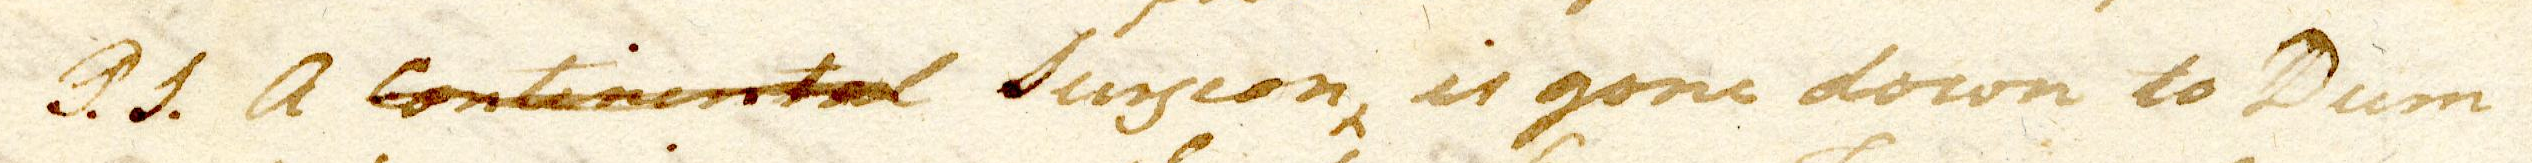P.S. A surgeon ^ is gone down to Dum
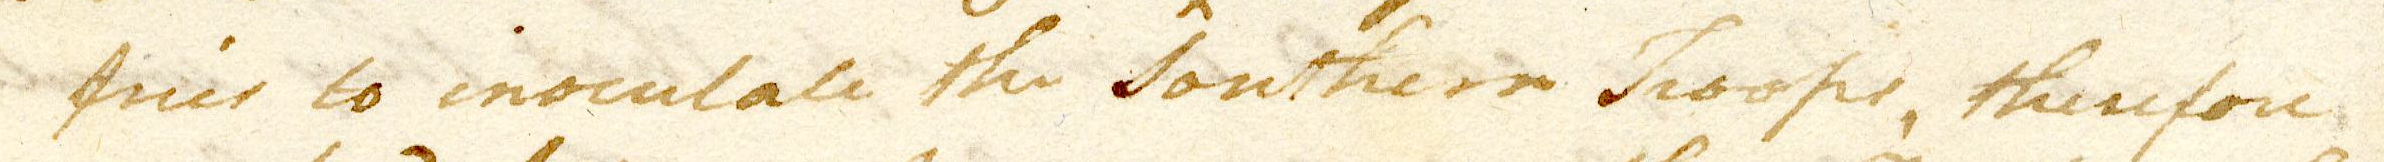fries to inoculate the Southern Troops, therefore
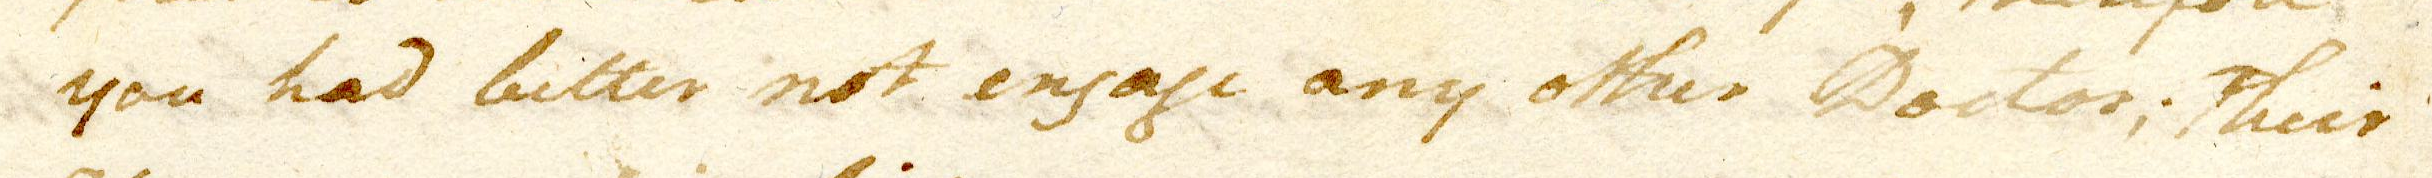you had better not engage any other Doctor; Their
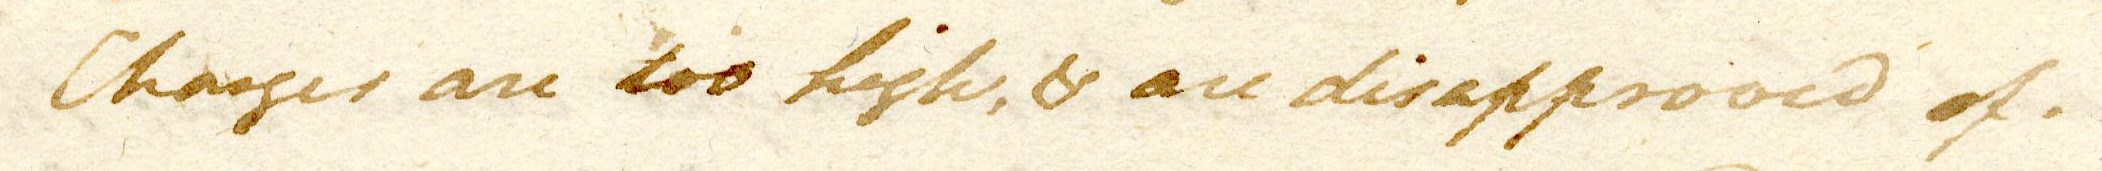Charges are too high, & are disapproved of
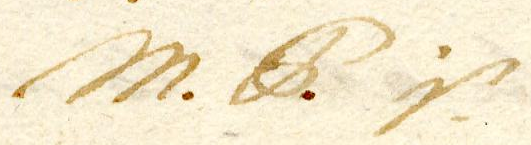M. P. j^r.
